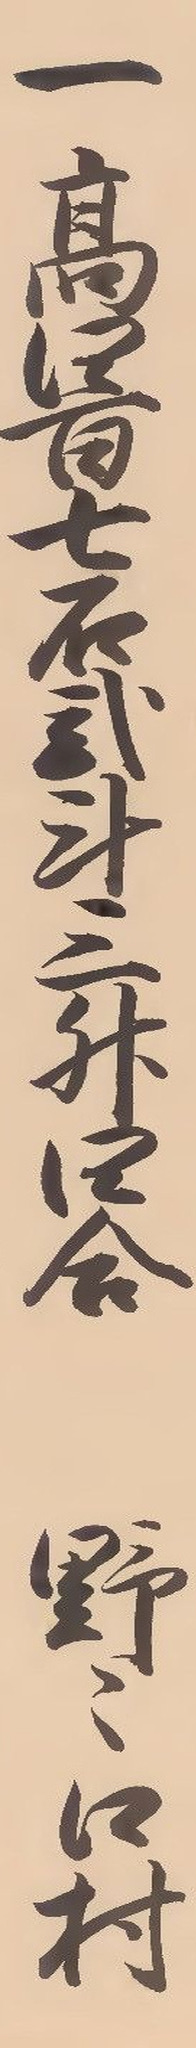一髙四百七石弐斗三升四合野々口村
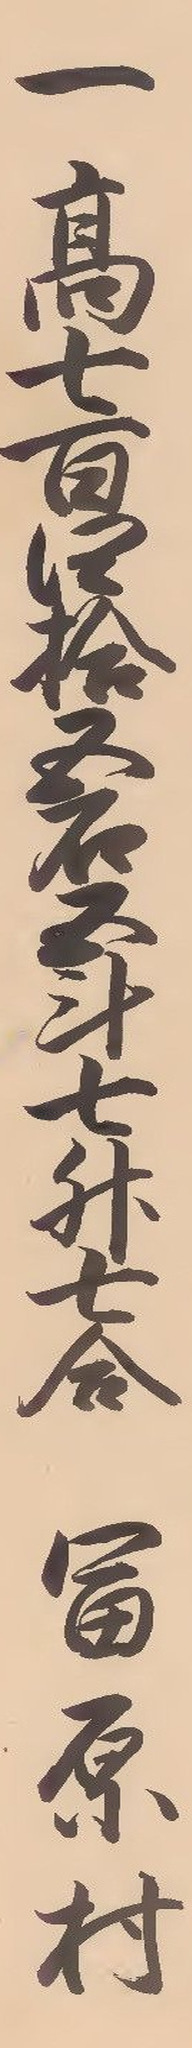一髙七百四拾五石五斗七升七合冨原村

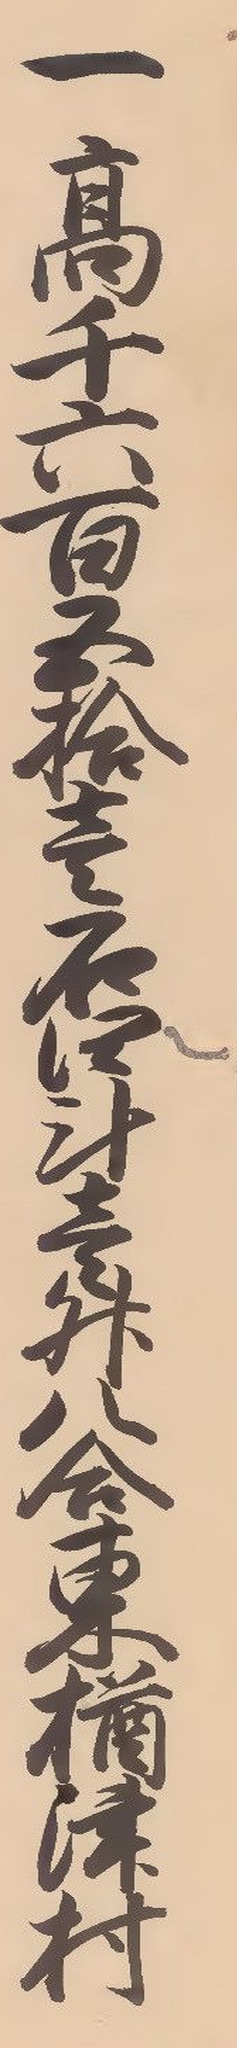一髙千六百五拾壱石四斗壱升八合東楢津村
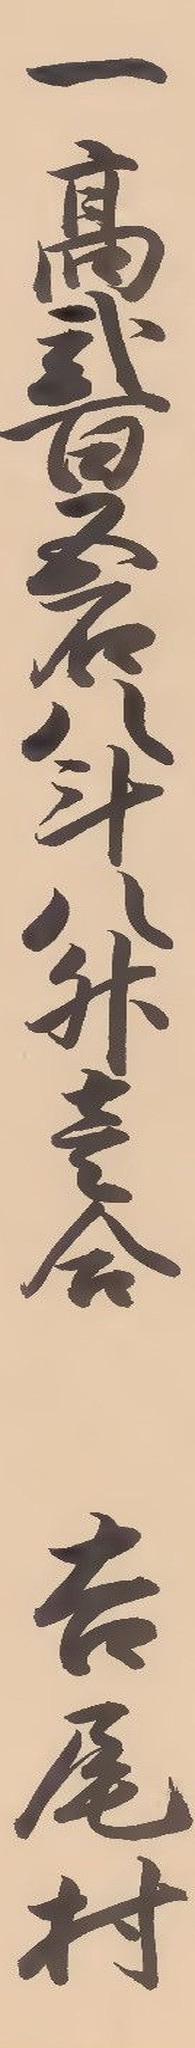一髙弐百五石八斗八升壱合吉尾村
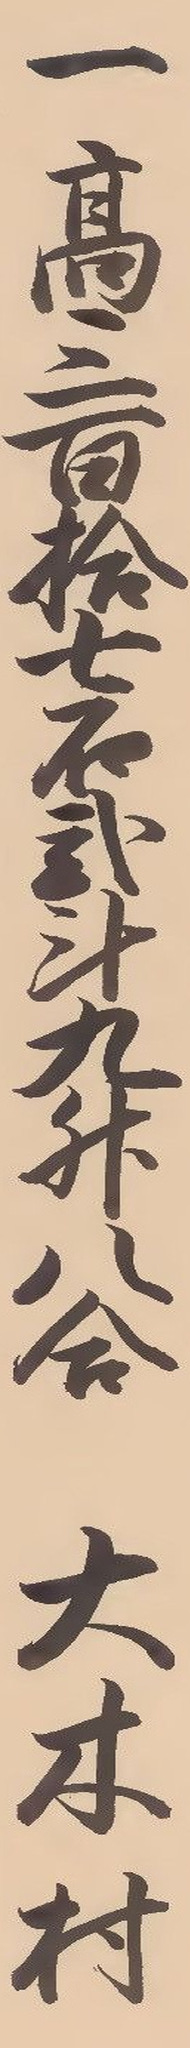一髙三百拾七石弐斗九升八合大木村
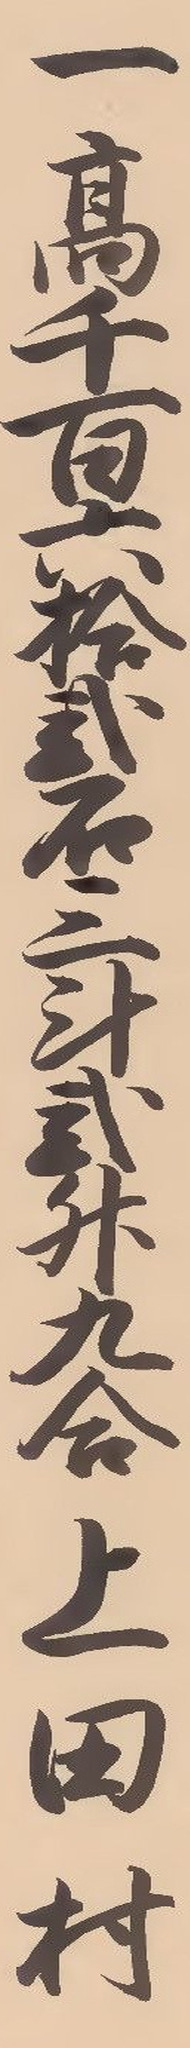一髙千百六拾弐石三斗弐升九合上田村
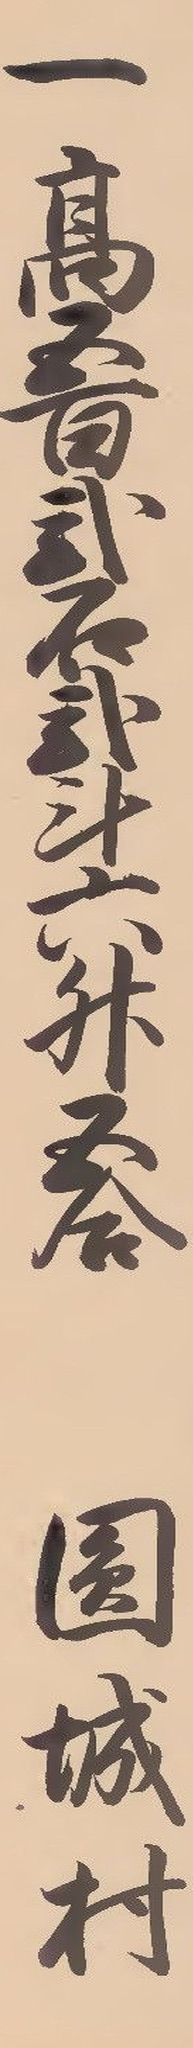一髙五百弐石弐斗六升五合圓城村
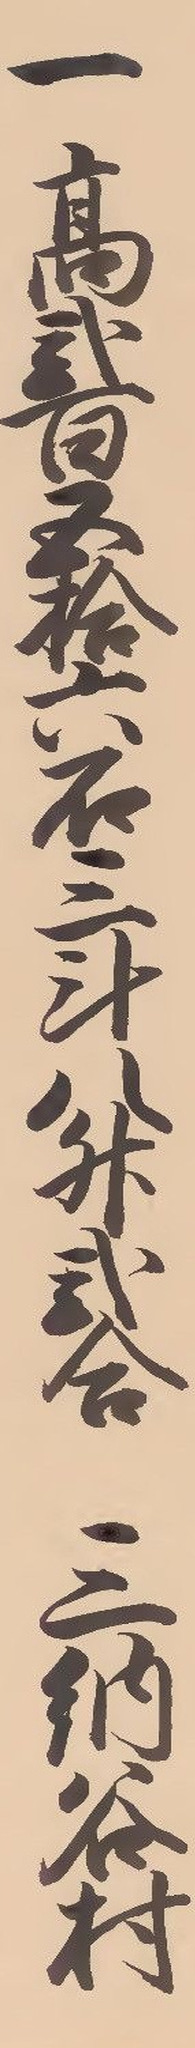一髙弐百五拾六石三斗八升弐合三納谷村
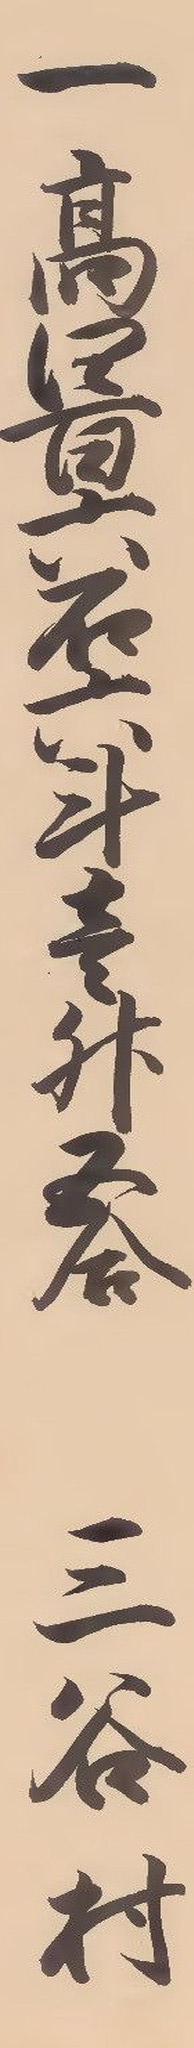一髙四百六石六斗壱升五合三谷村
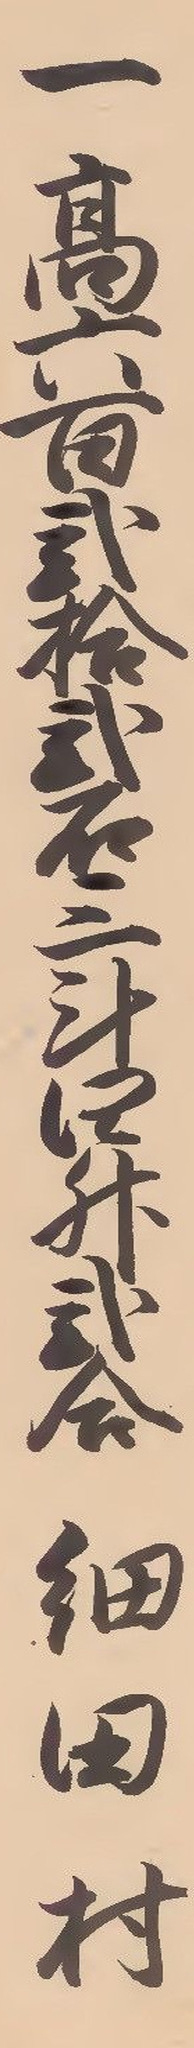一髙六百弐拾弐石三斗四升弐合細田村

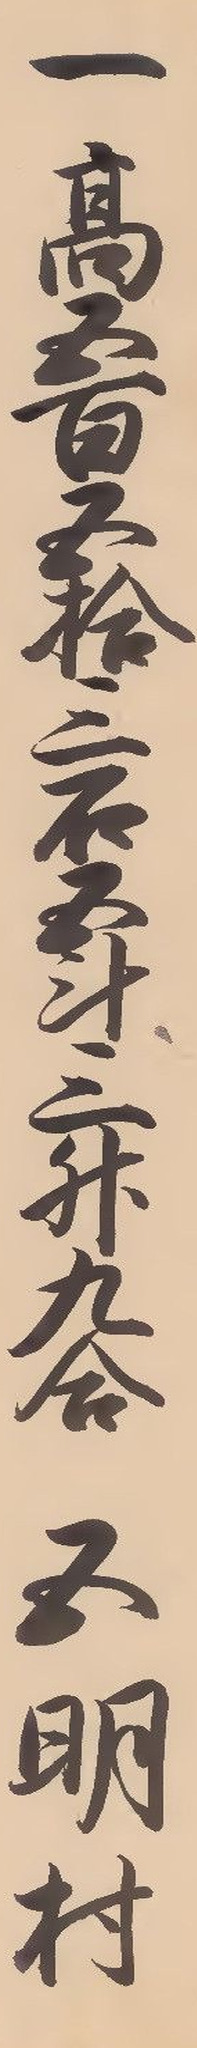一髙五百五拾三石五斗三升九合五明村
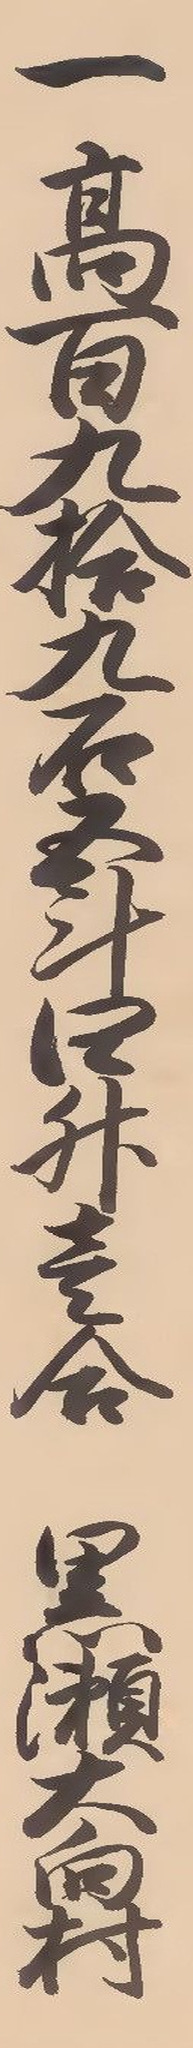一髙百九拾九石五斗四升壱合黒瀬大向村
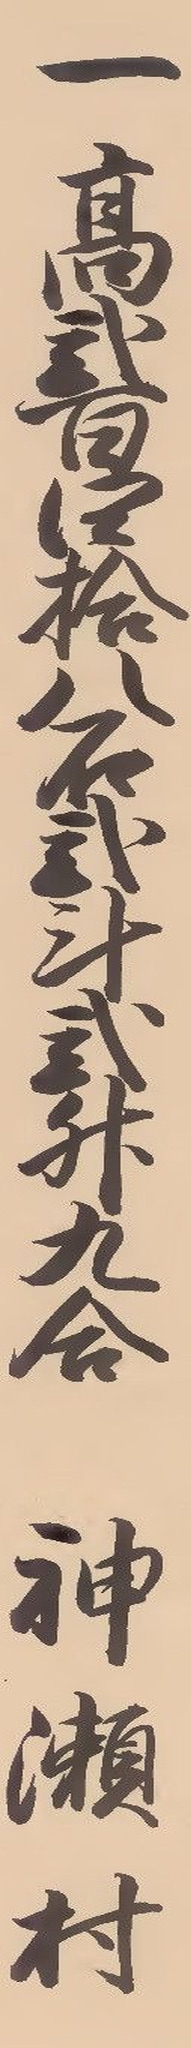一髙弐百四拾八石弐斗弐升九合神瀬村
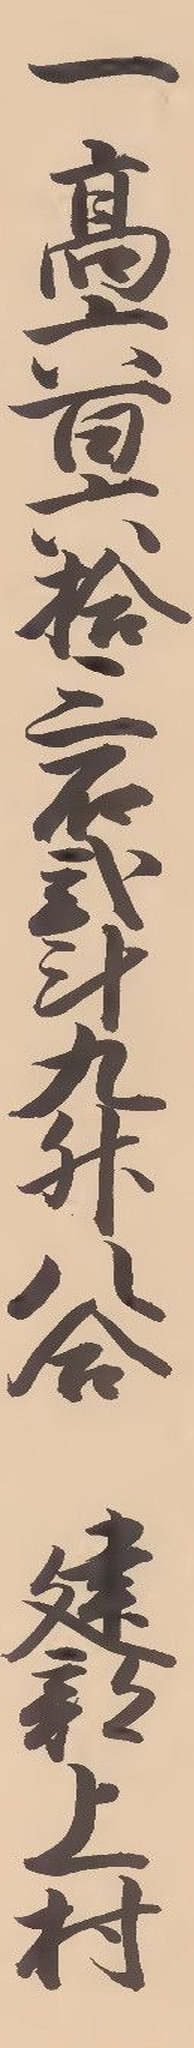一髙六百六拾三石弐斗九升八合建部上村
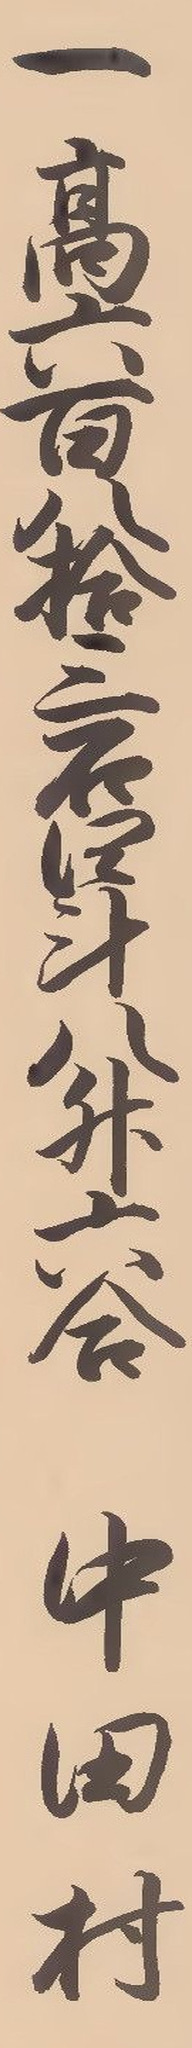一髙六百八拾三石四斗八升六合中田村
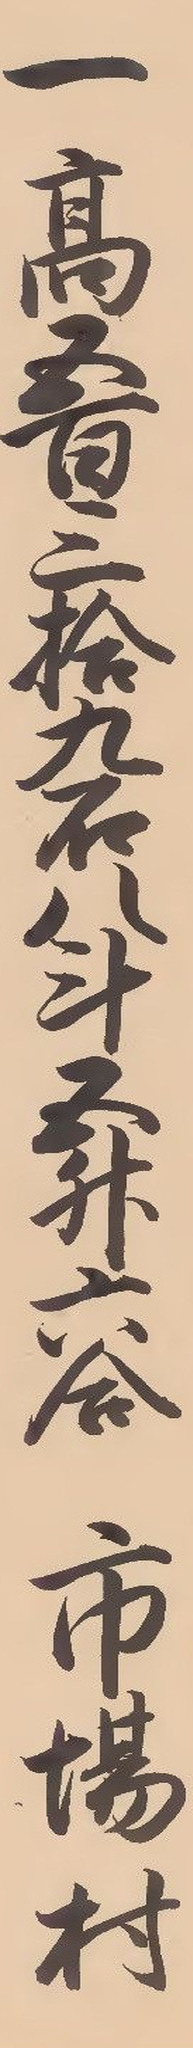一髙五百三拾九石八斗五升六合市場村
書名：備前国郷帳
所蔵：国立公文書館 National Archives of Japan
